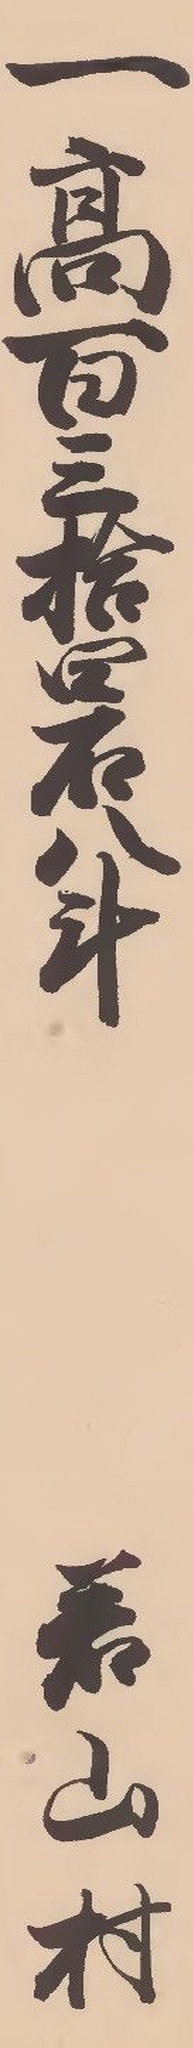一高百三拾四石八斗若山村
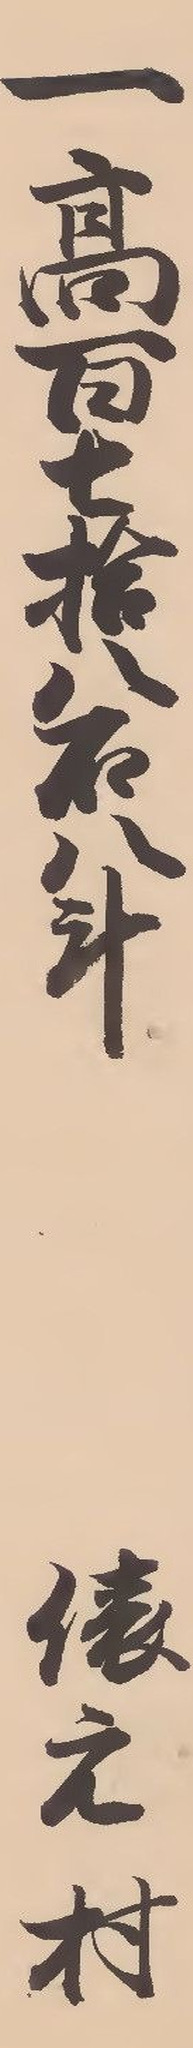一高百七拾八石八斗俵元村
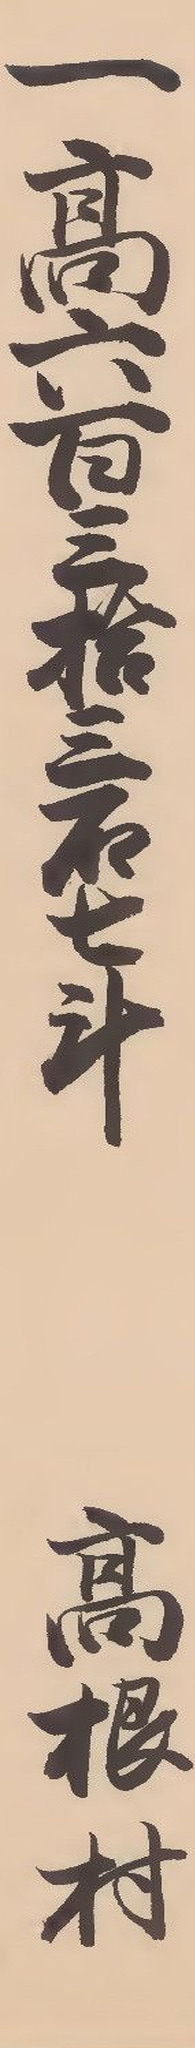一高六百三拾三石七斗高根村

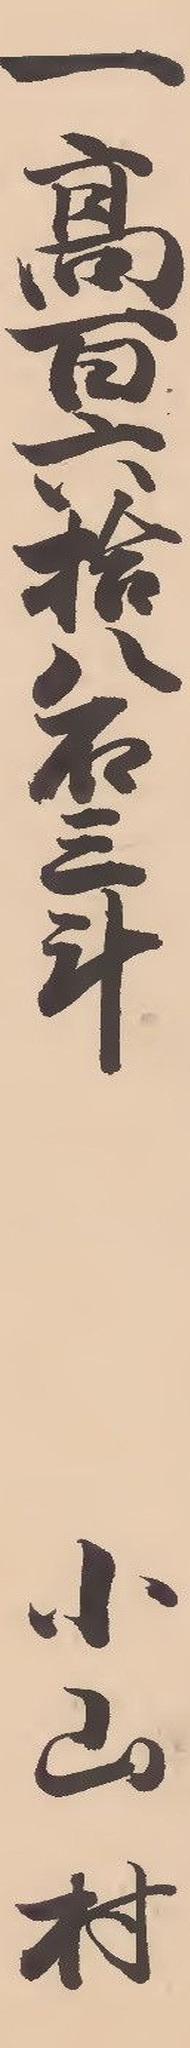一高百六拾八石三斗小山村
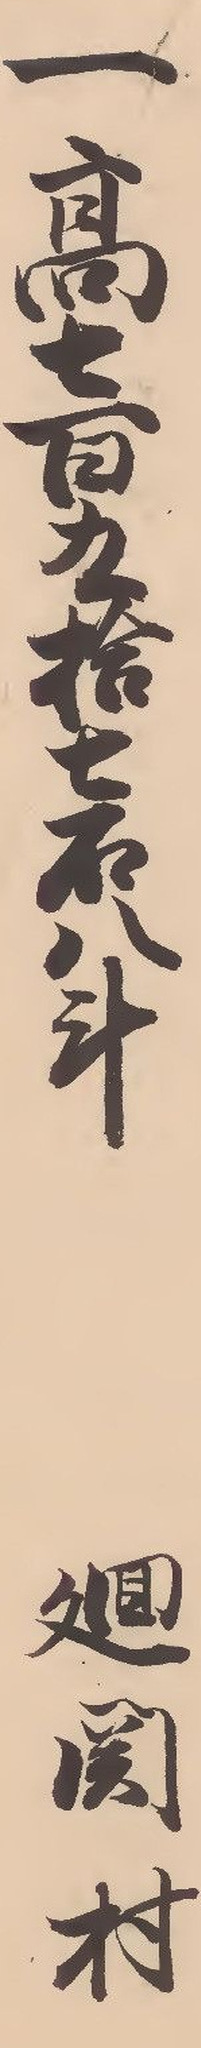一高七百九拾七石八斗廻関村

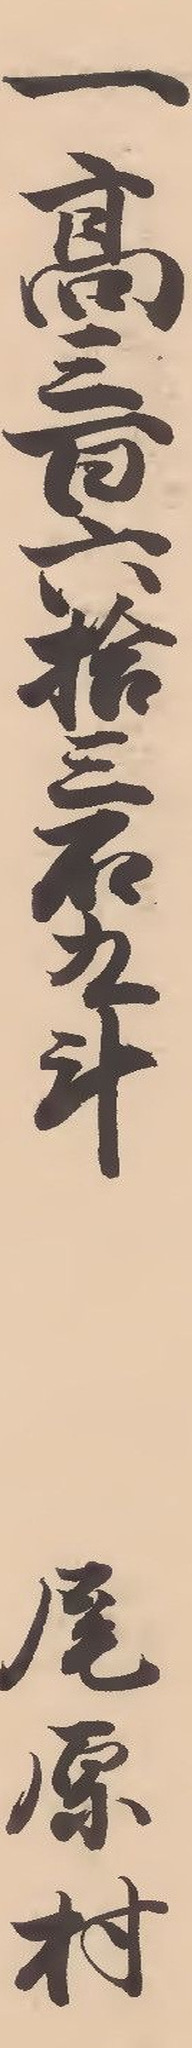一高三百六拾三石九斗尾原村
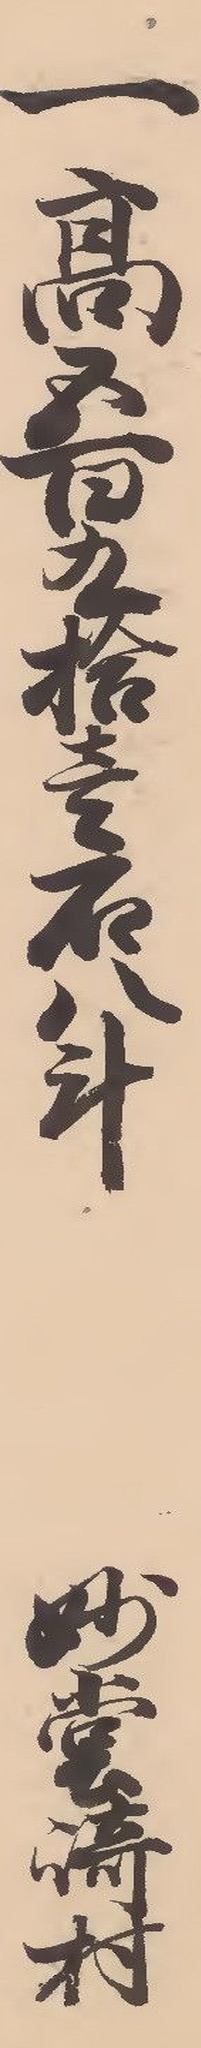一高五百九拾壱石八斗妙堂崎村
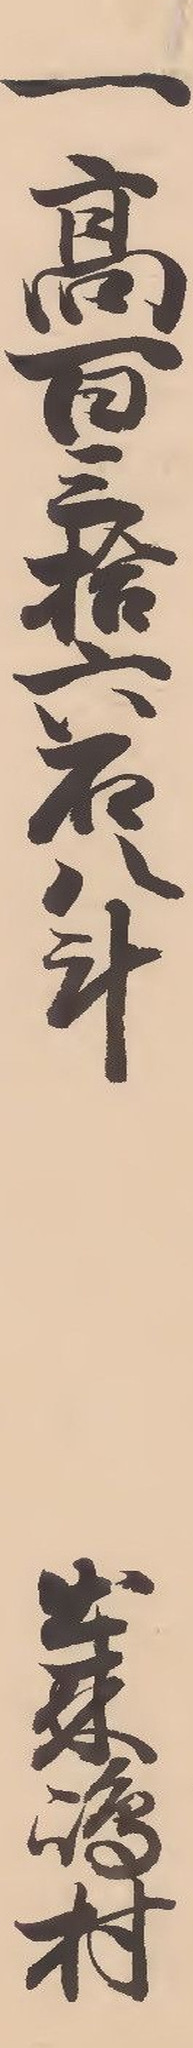一高百三拾六石八斗出来島村
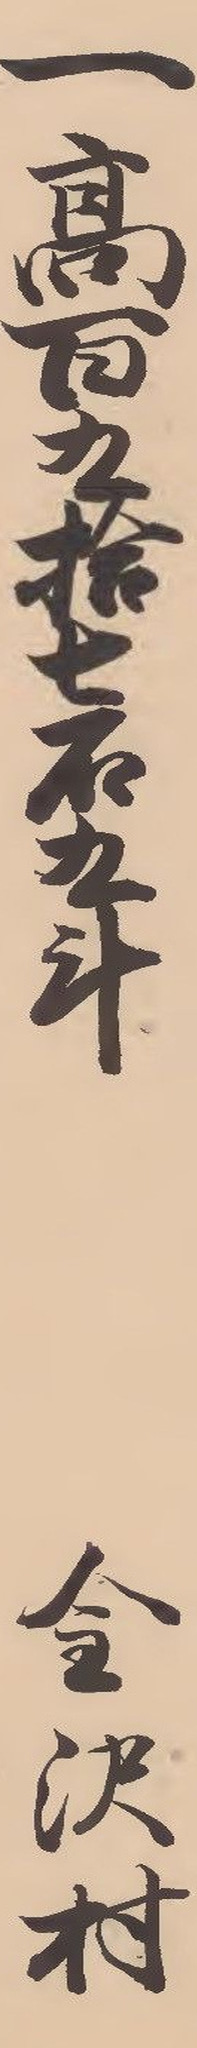一高百九拾七石九斗金沢村
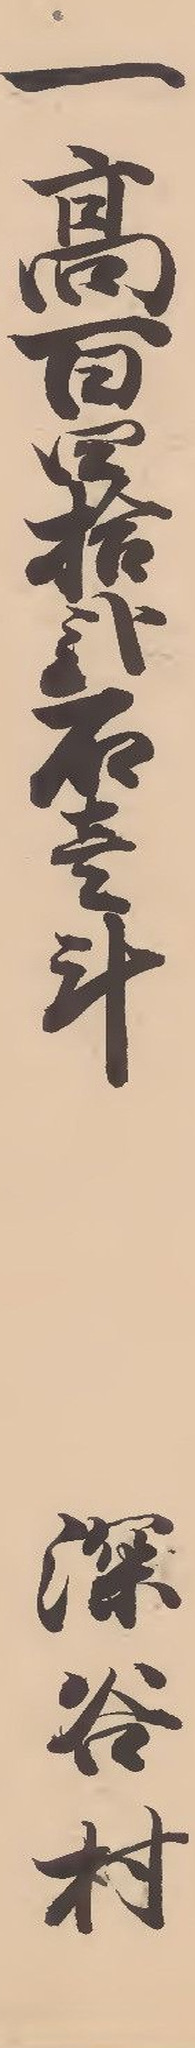一高百四拾弐石壱斗深谷村

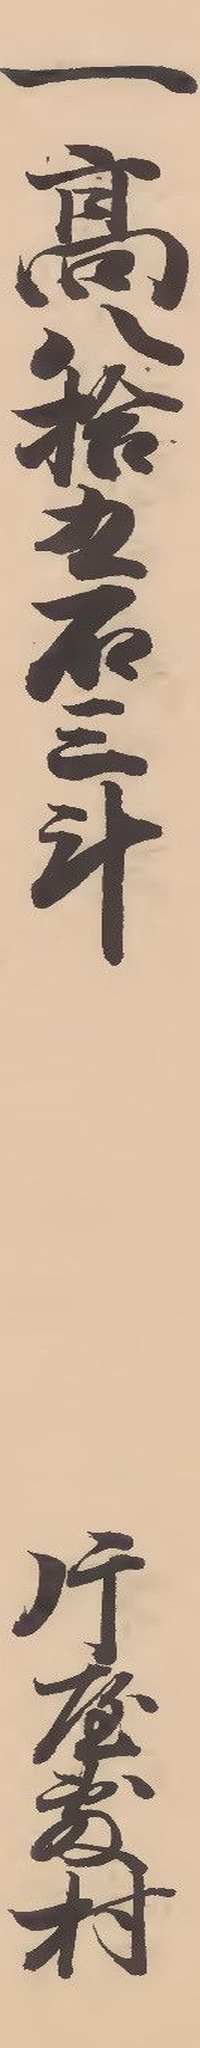一高八拾九石三斗片屋敷村
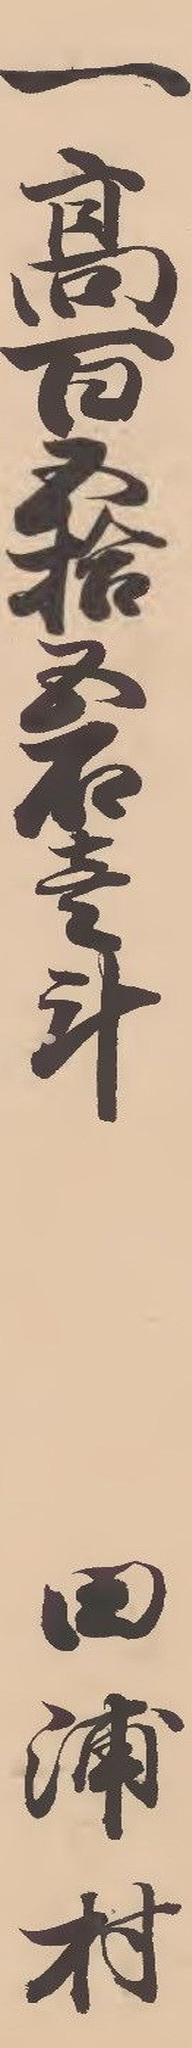一高百五拾五石壱斗田浦村
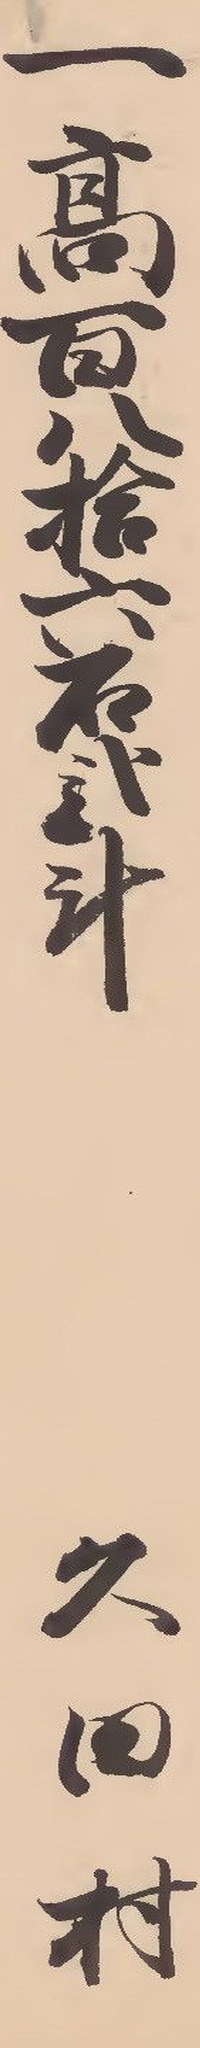一高百八拾六石弐斗久田村

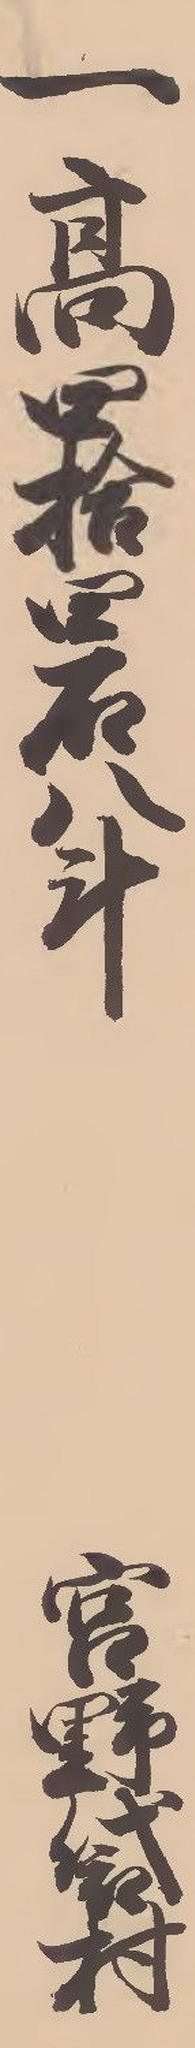一高四拾四石八斗宮野袋村
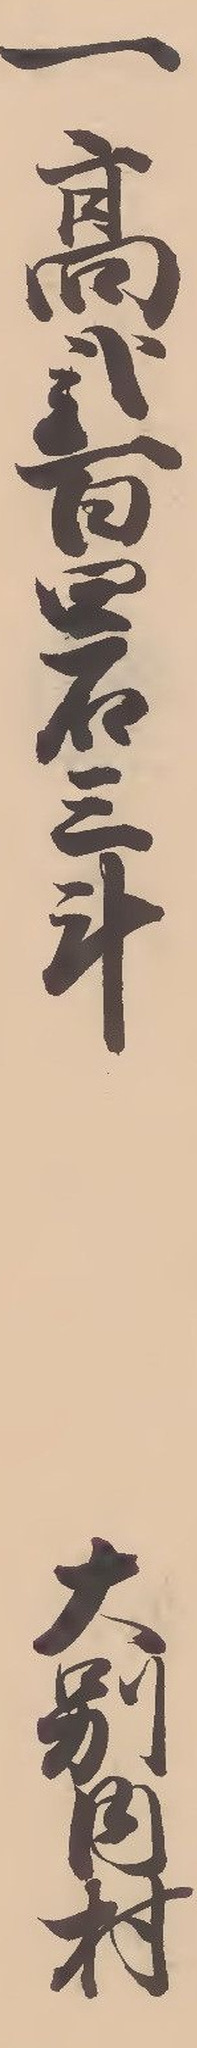一高弐百四石三斗大別内村

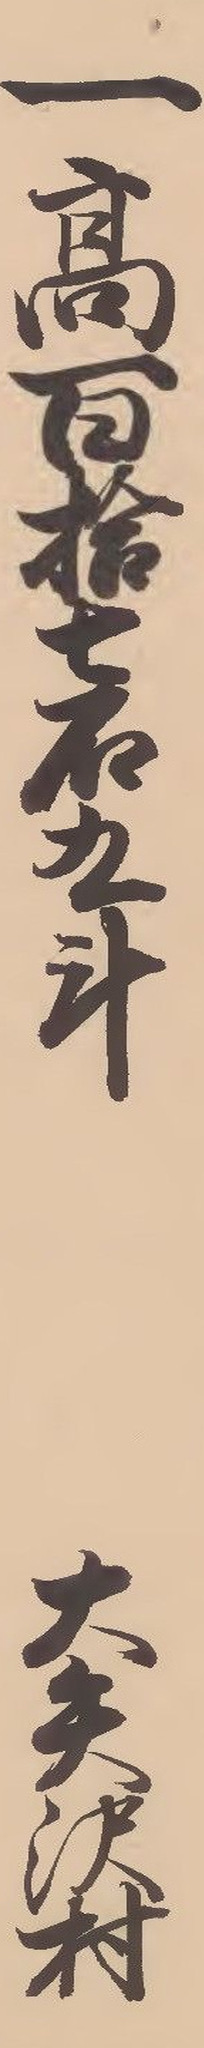一高百拾七石九斗大矢沢村
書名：陸奥国郷帳　７
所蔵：国立公文書館 National Archives of Japan
